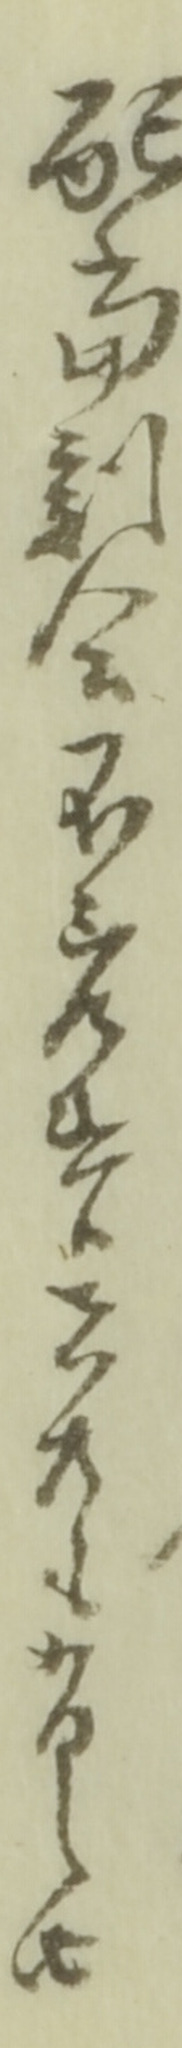配当割合不差出候者共も有之由
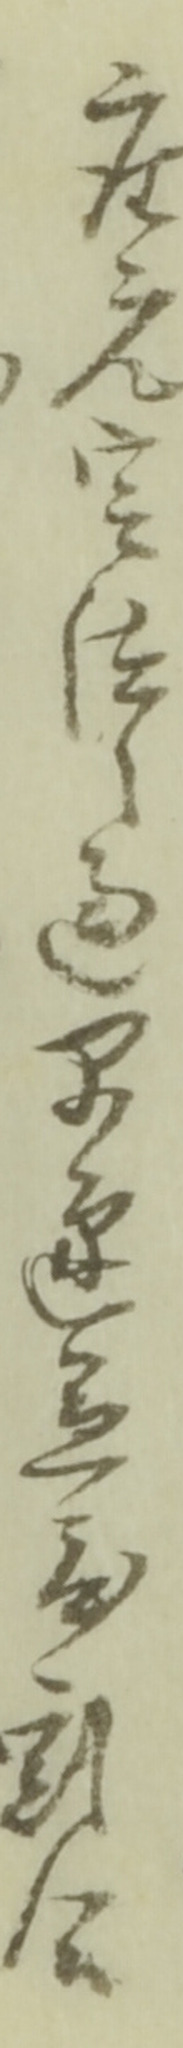座元定法之通早速急度割合
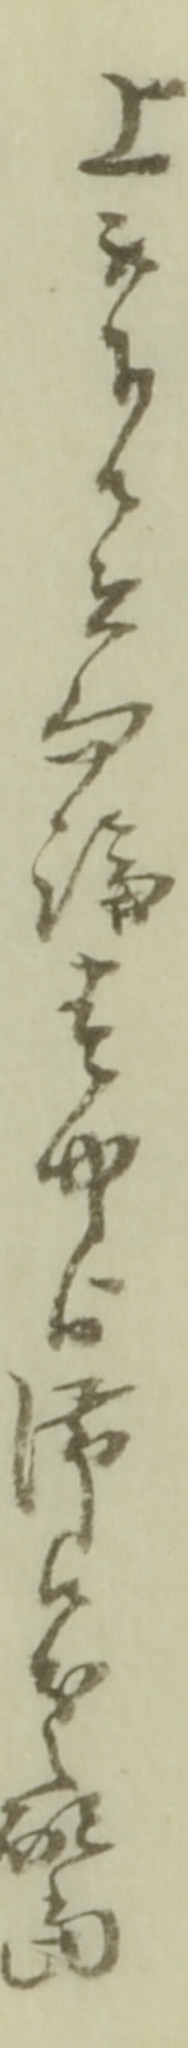上被下候者勿論春中より滞候義之配当
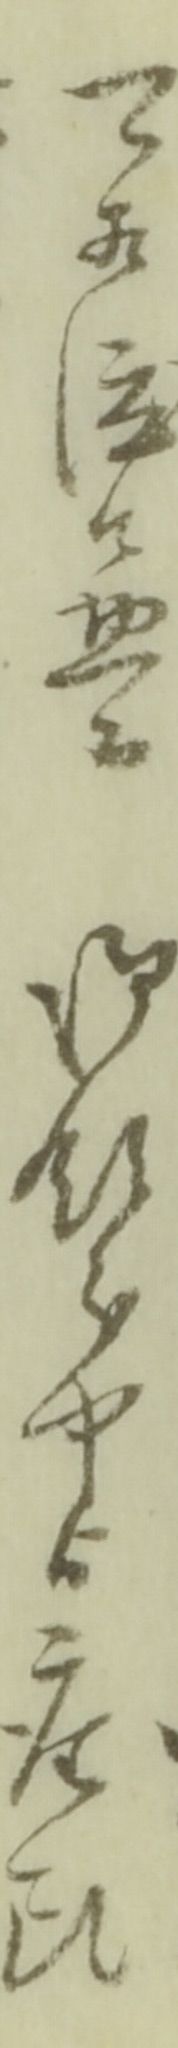可相渡候惣而御領分中より座頭
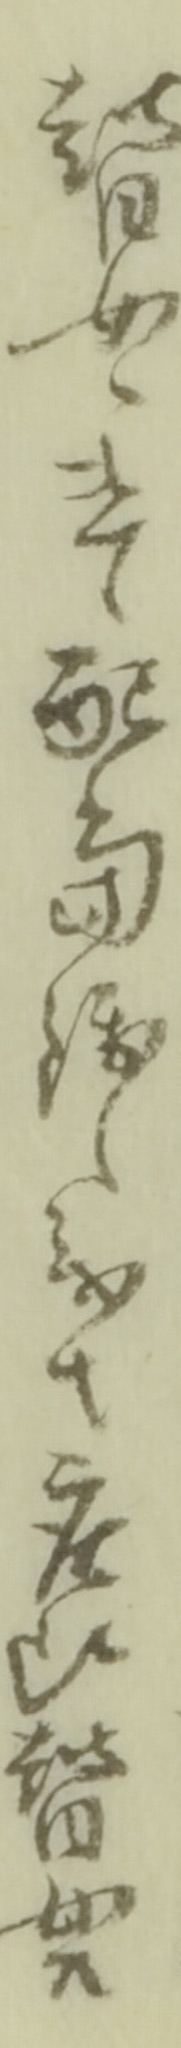瞽女へ遣候配当銭之義者座頭瞽女共
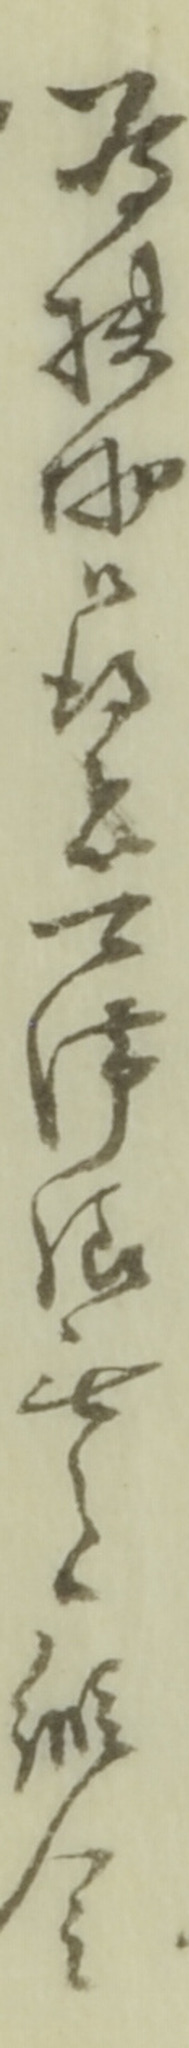為扶助候得者可滞様無之候縦令
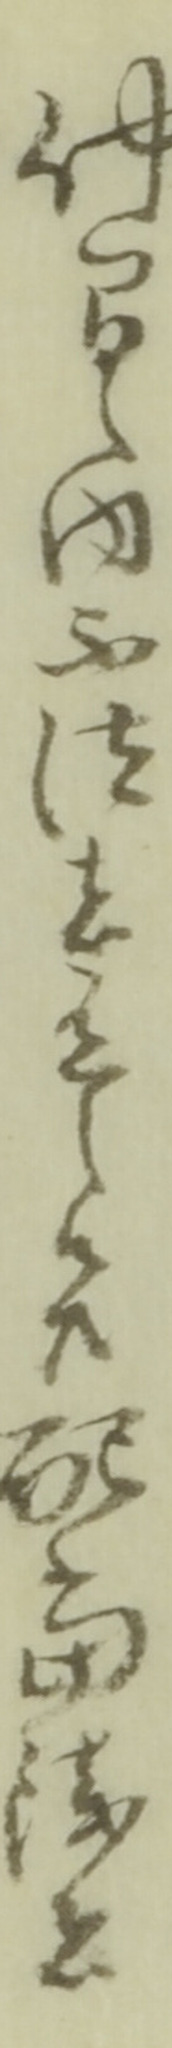仲間之内不法者有之候共配当銭者
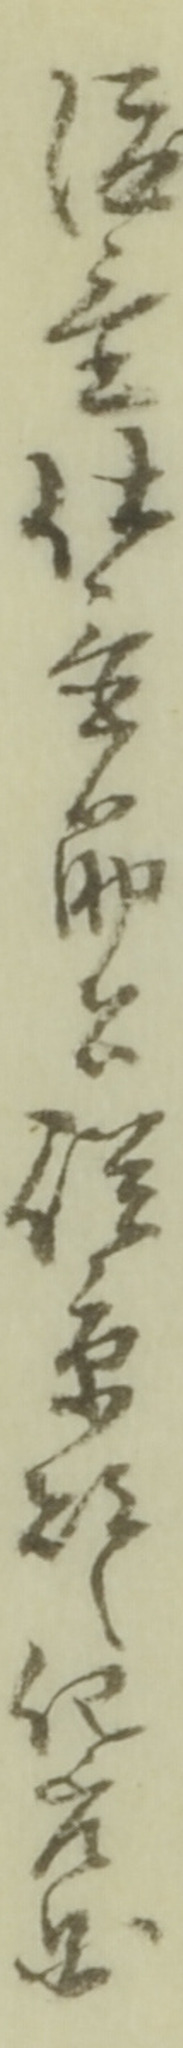渡置仕置筋者従京都之紀厳圓
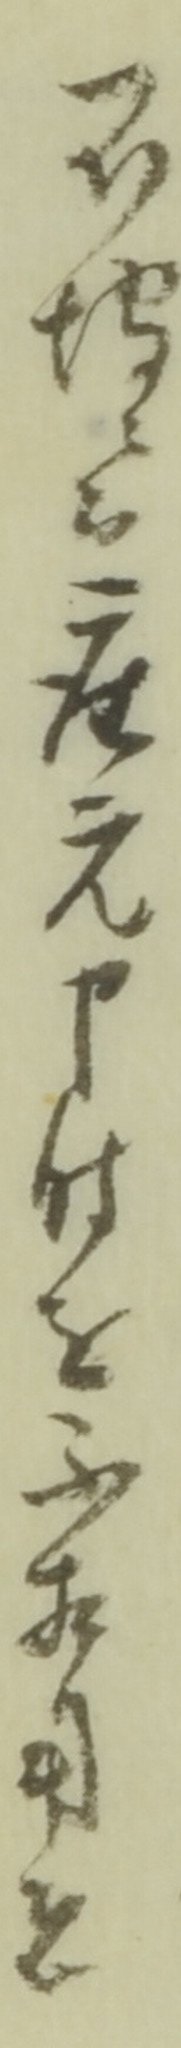不埒二而座元申付を不相用者
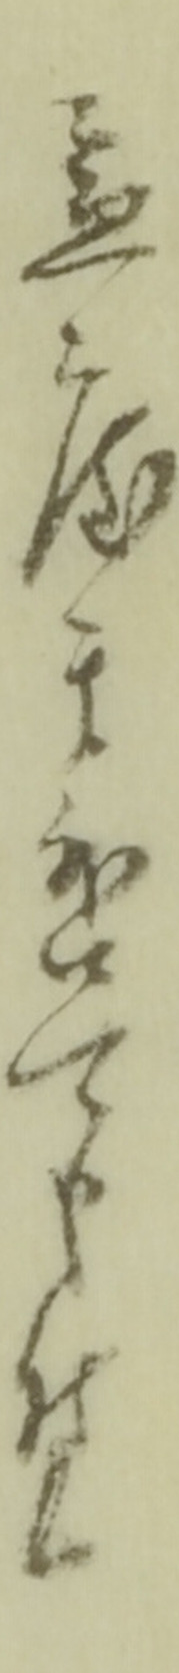急度其外え可申付候
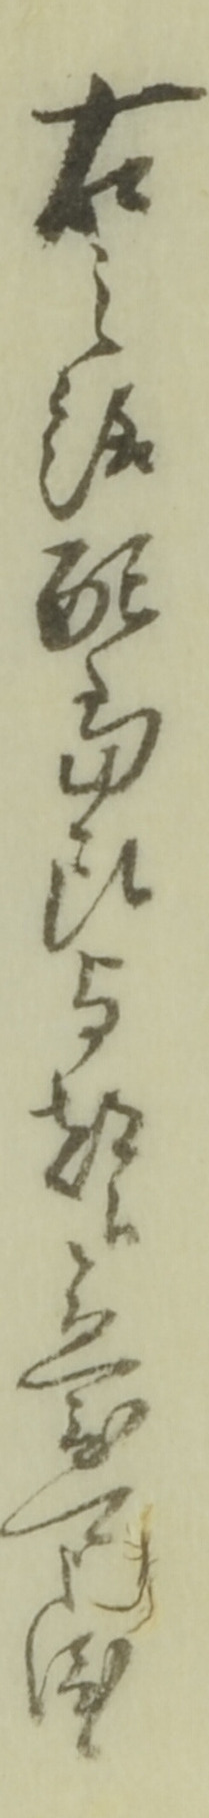右之趣配当頭より都而急度可申渡候
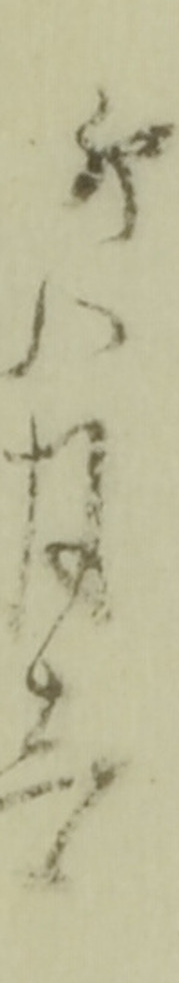卯八月十二日
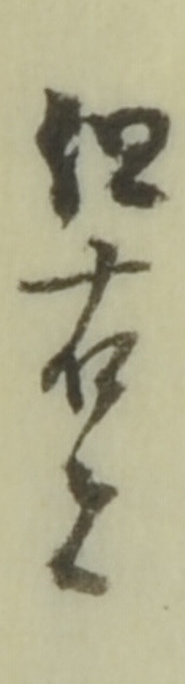但右者

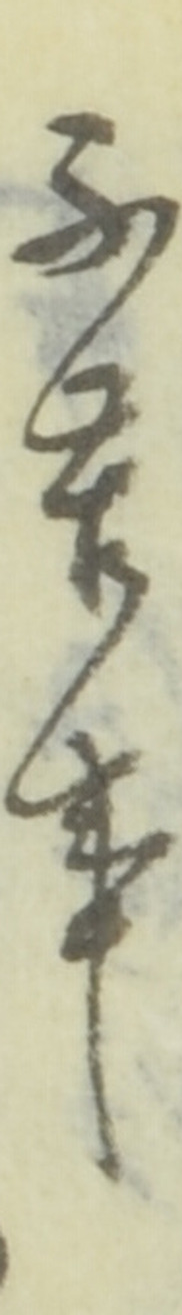不苦事
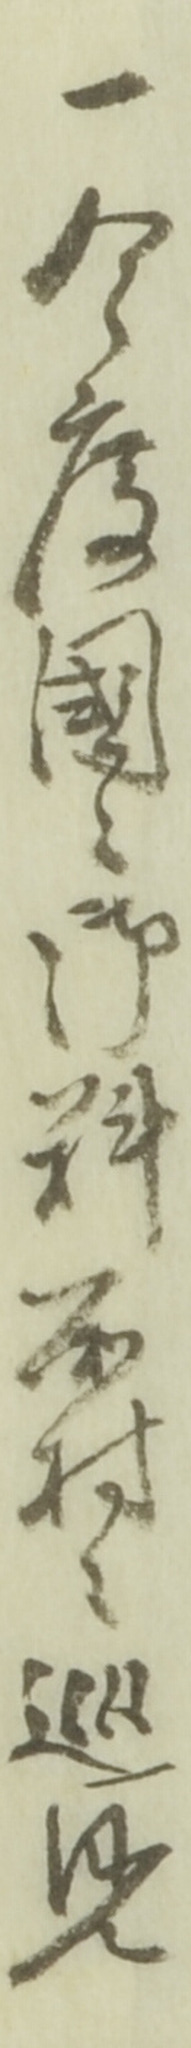一今度国之御料所村ゝ巡見
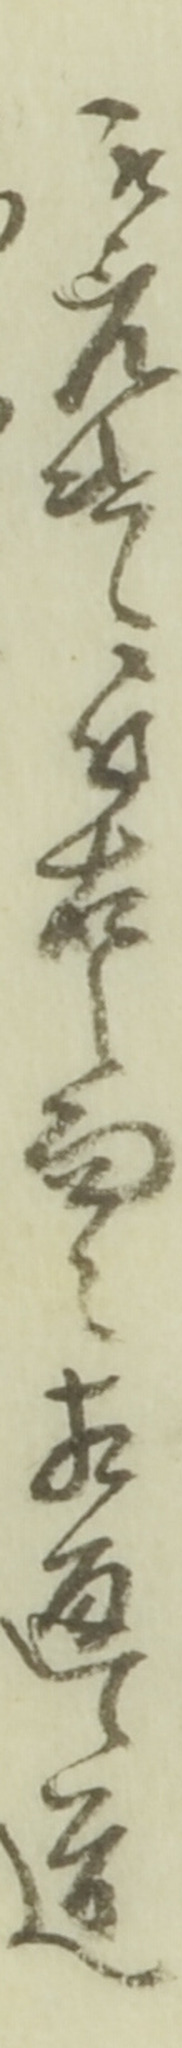被差遣候二付右之面々相通候道
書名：御公儀様御領主様御触書控
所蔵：伊那市立高遠町図書館・合同会社AMANE
